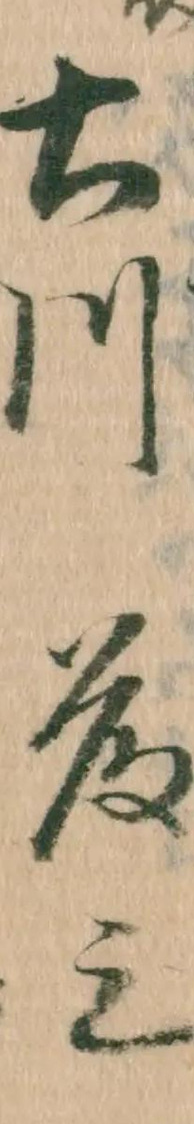大川藤三
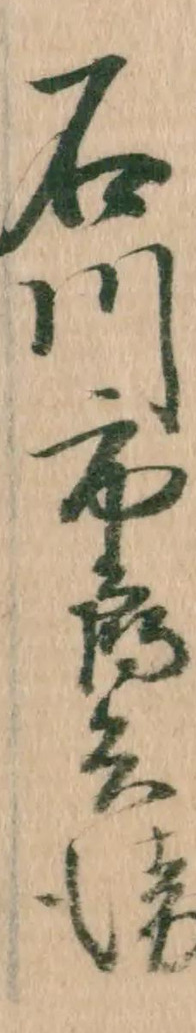石川市郎兵衛
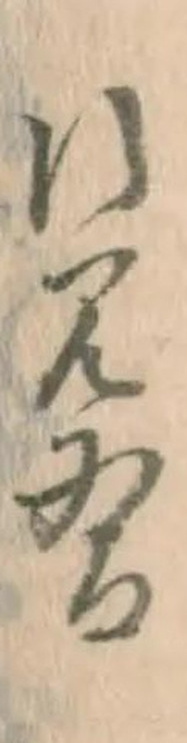同見習
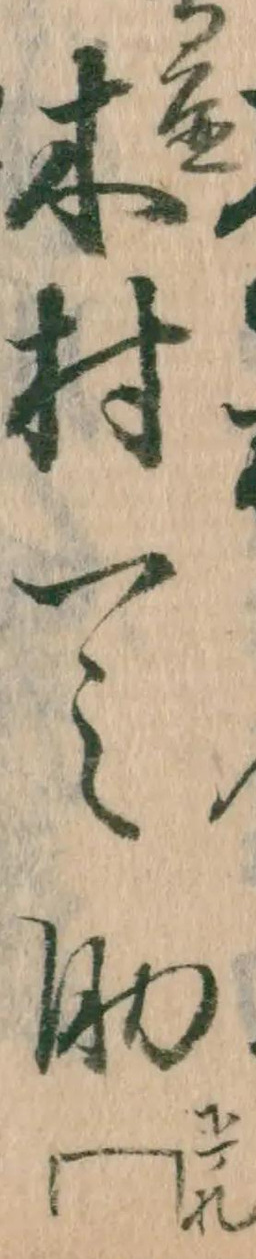木村一之助└
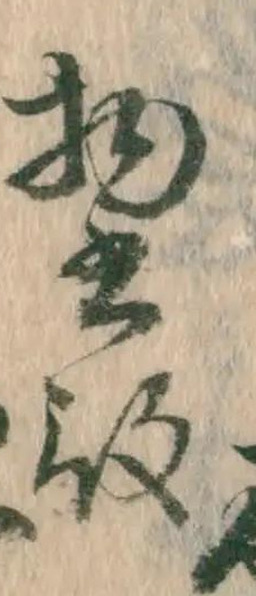物書役
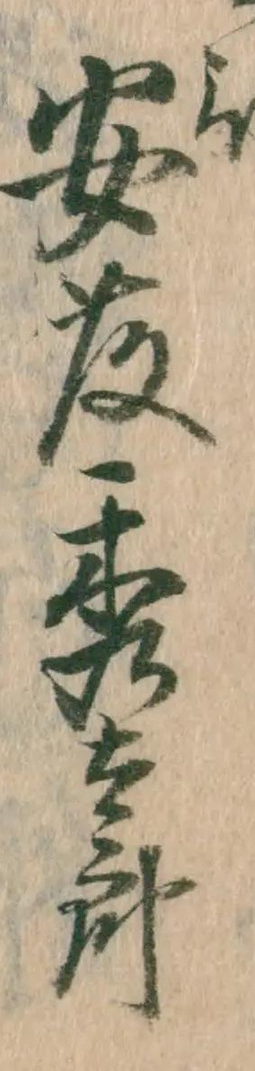安藤秀太郎
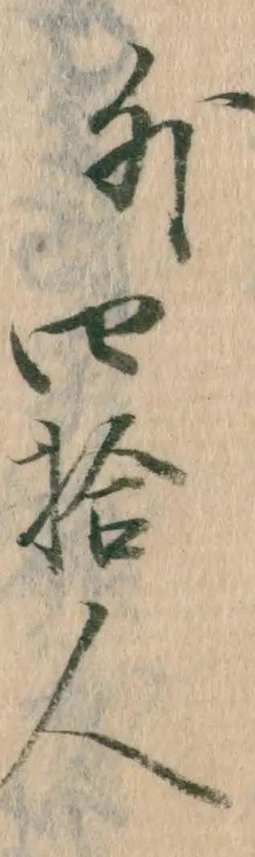外四拾人
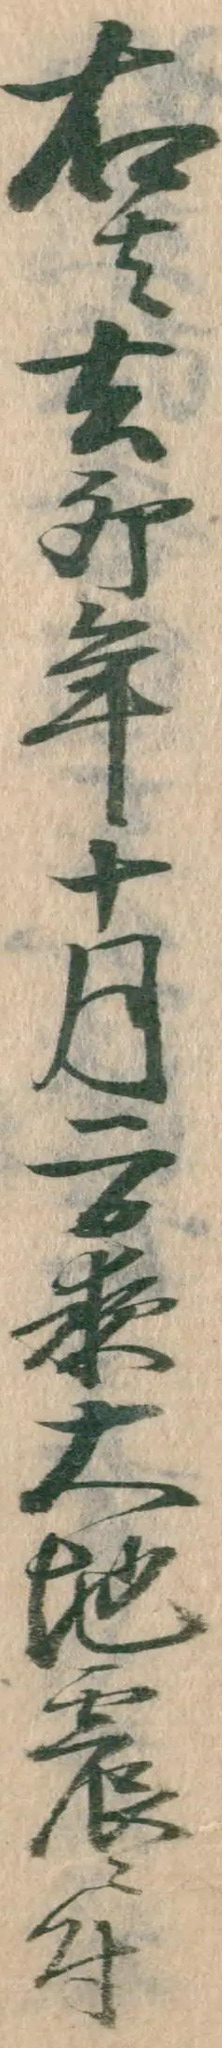右は去卯年十月二日夜大地震ニ付
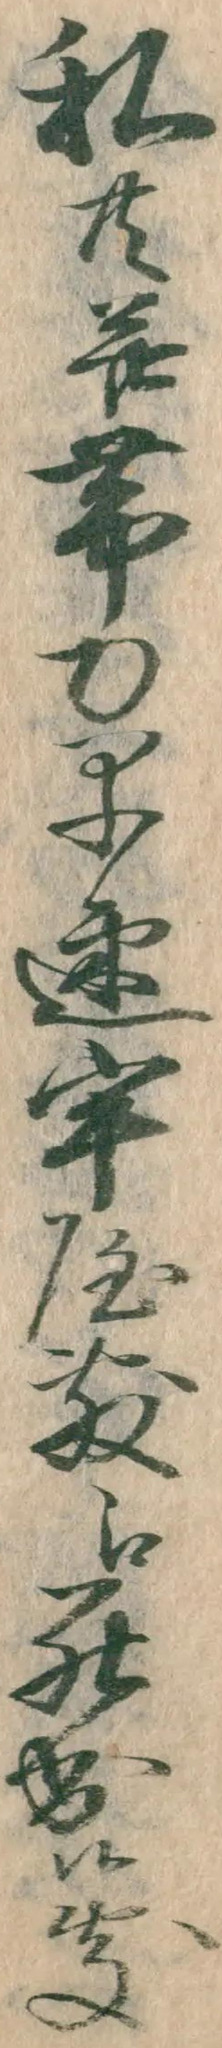私共幷帯刀早速牢屋敷え罷出候処

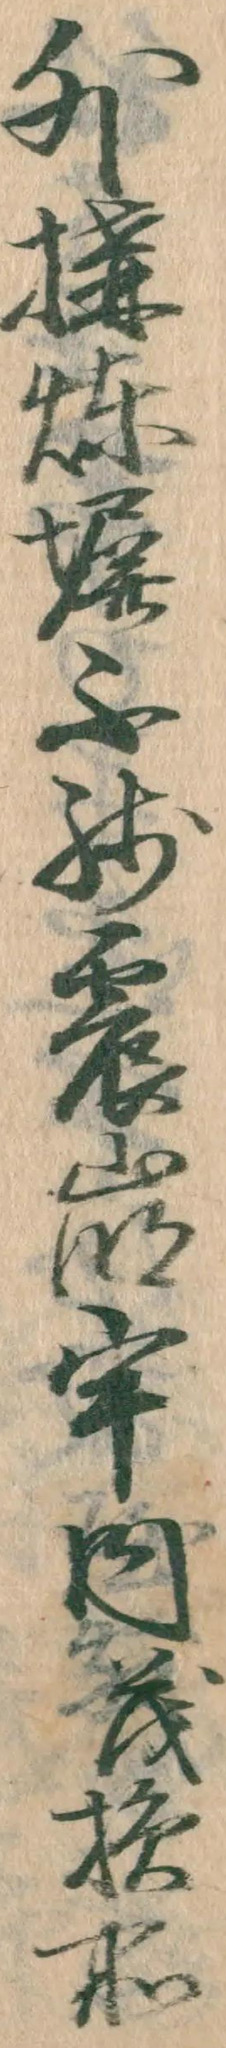外構煉塀不残震崩牢内も損所
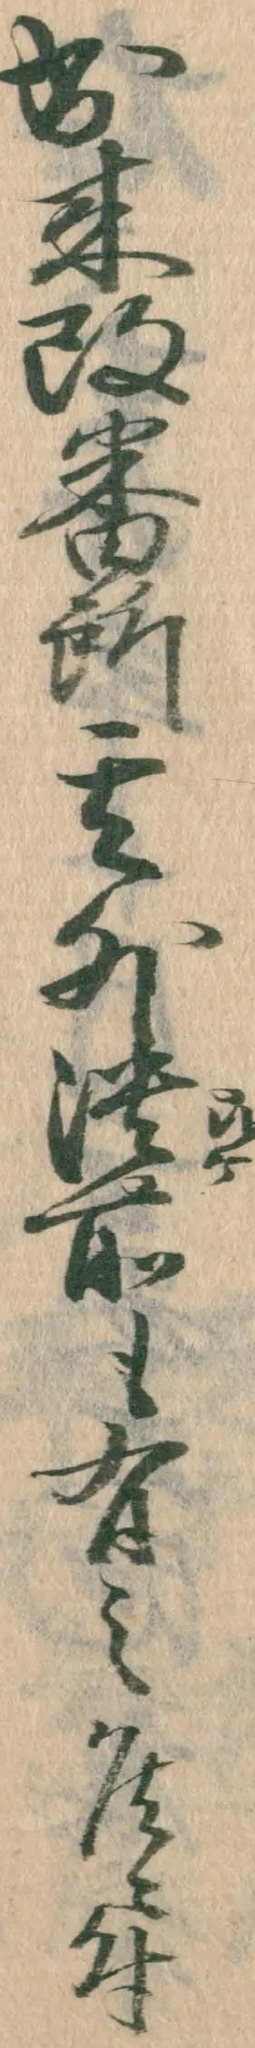出来改番所其外潰候ケ所も有之候ニ付
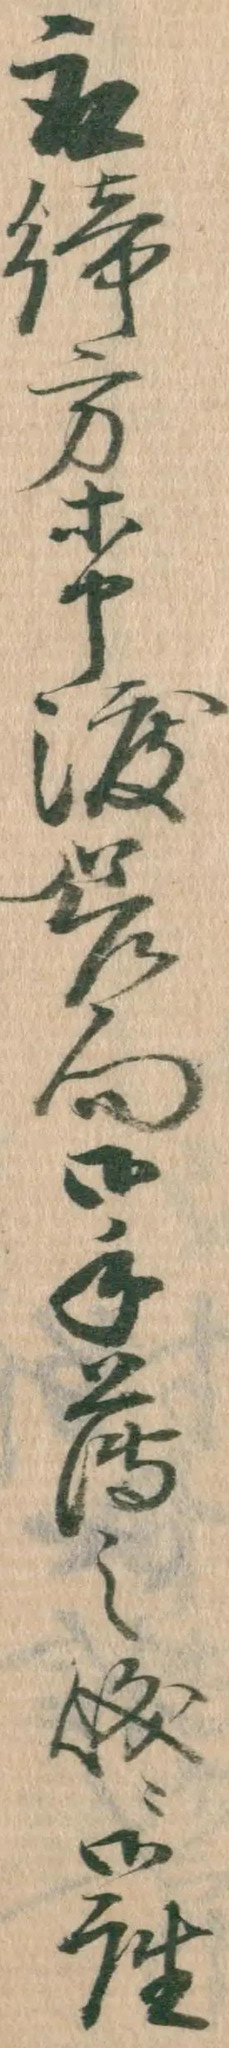取締方等申渡差向御手薄之儀ニ御座
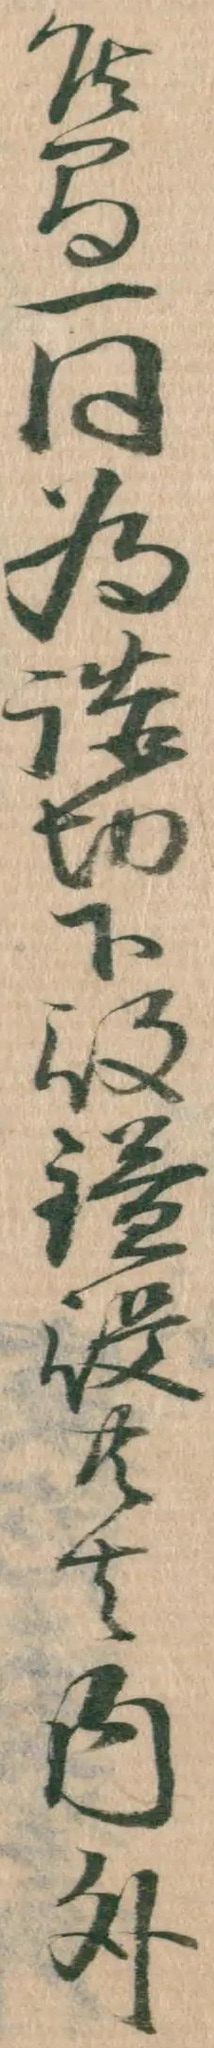候間一同為詰切下役鎰役共は内外
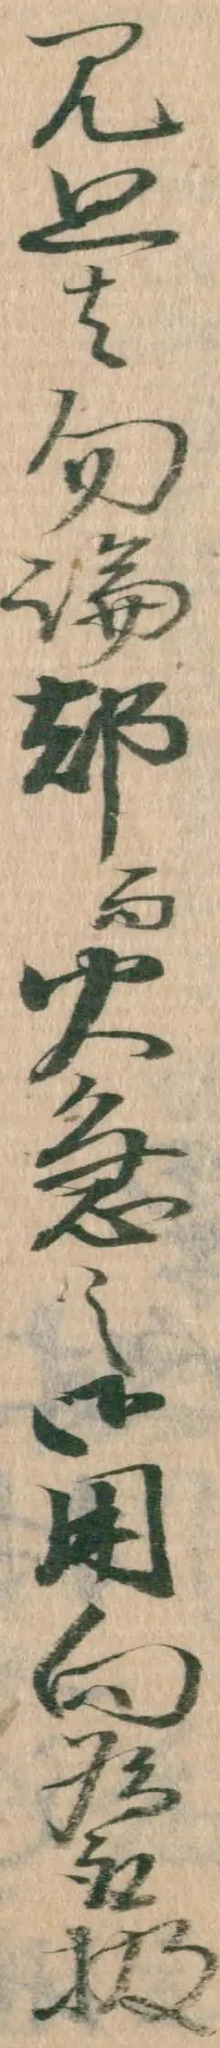見廻は勿論都て火急之御用向為取扱
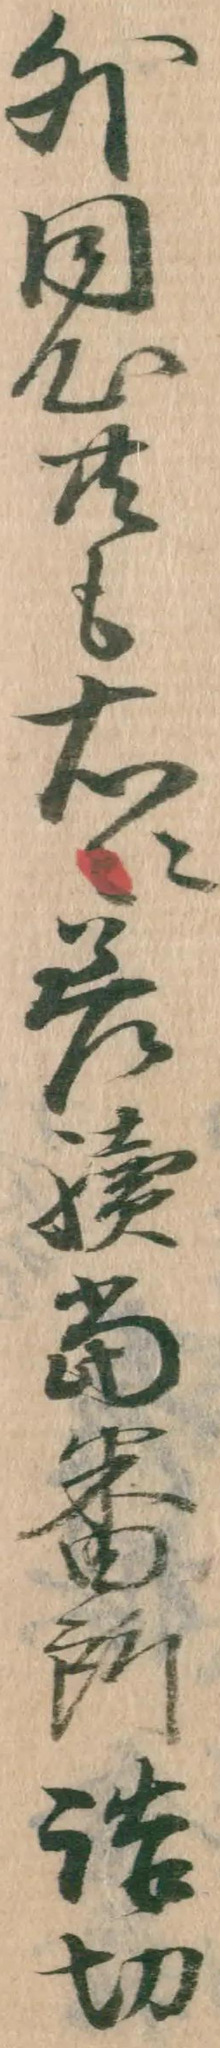外同心共も右ニ差続当番所詰切
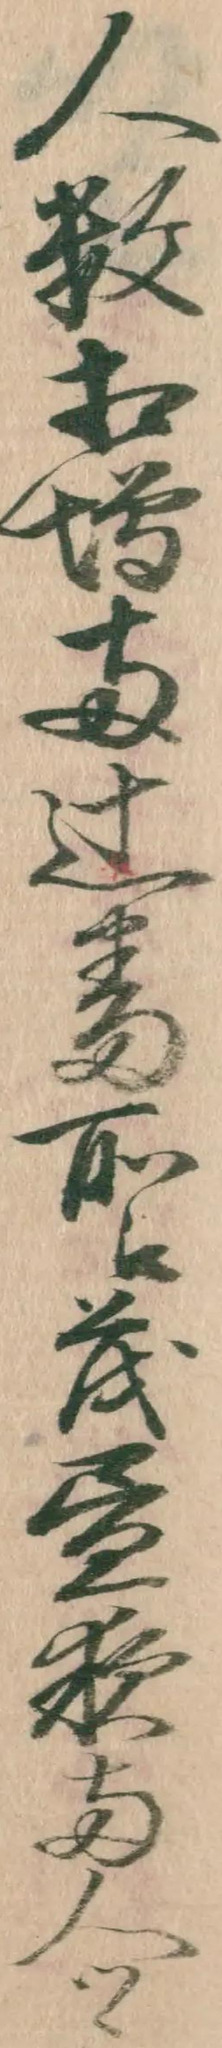人数相増両辻番所えも昼夜両人ツヽ
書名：七十冊物類集 71巻. [44] 四十三 牢屋敷御普請御修覆地震ニ付骨折候牢屋掛御褒美之部
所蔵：国立国会図書館 National Diet Library, JAPAN
